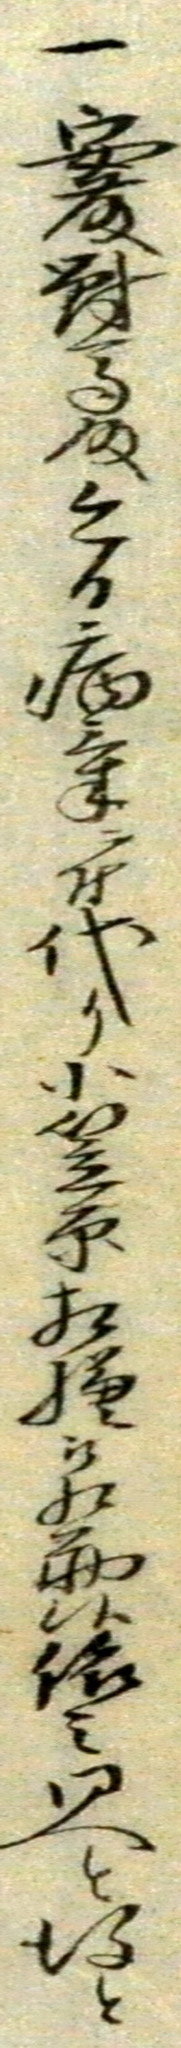一安藤對馬殿今日病気ニ付代り小笠原相模被相勤候依之同人と得と
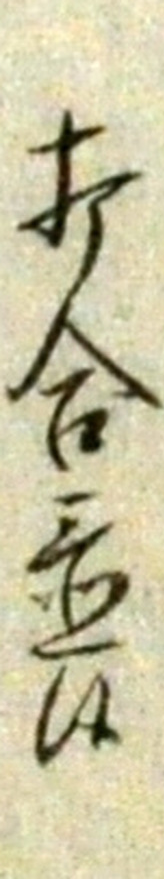打合置候
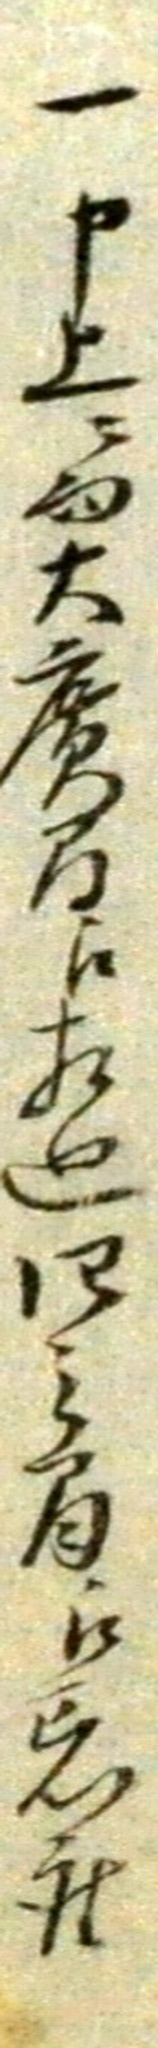一申上ニ而大廣間え相廻四之間え着座
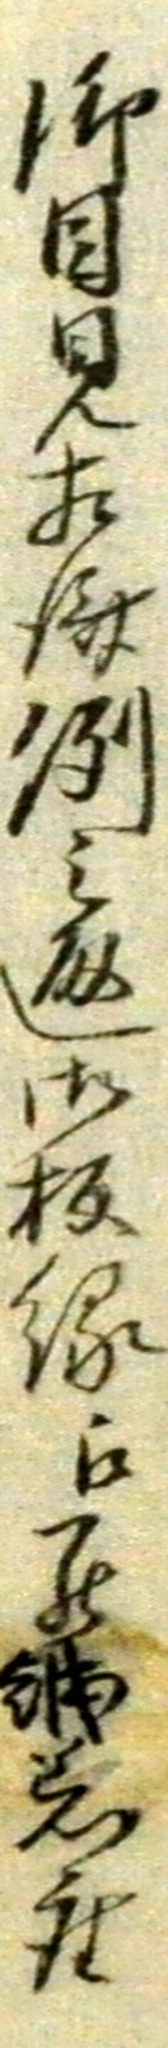御目見相済例の通御板縁え罷越着座
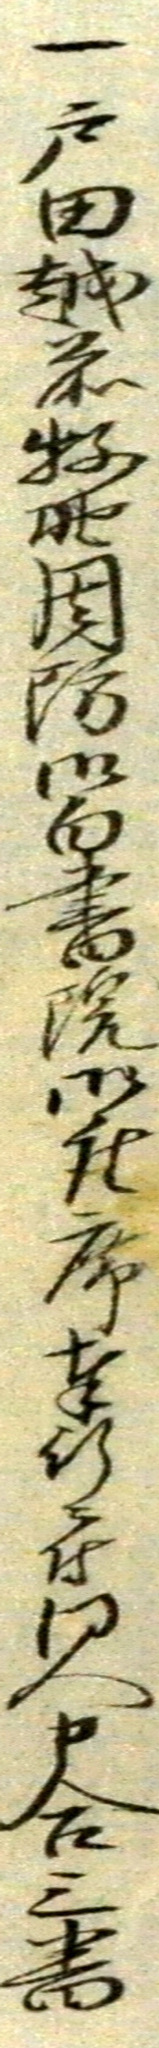一戸田越前牧野周防御白書院御座席奉行ニ付同人申合三番
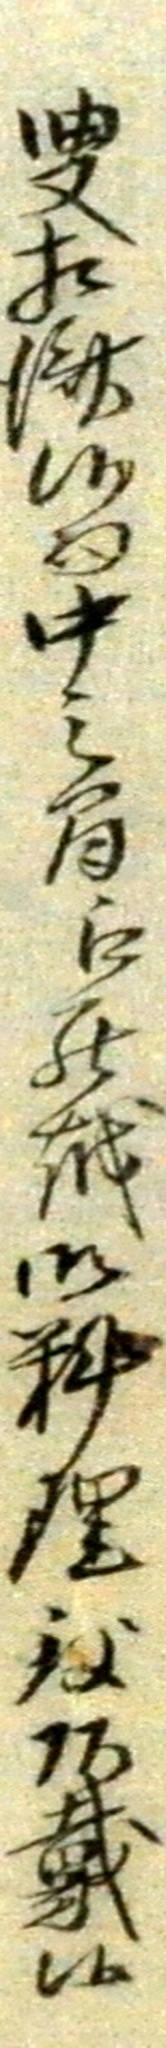叟相済候而中之間え罷越御料理致頂戴候
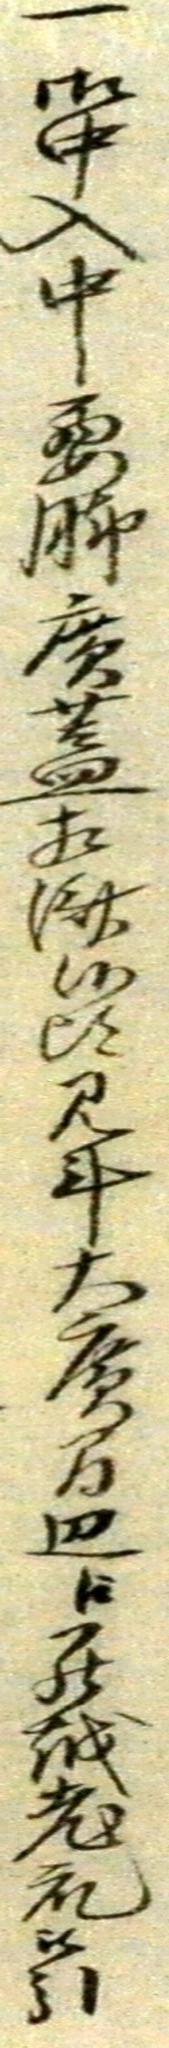一御中入中要脚廣蓋相済候頃見斗大廣間辺え罷越老衆被引
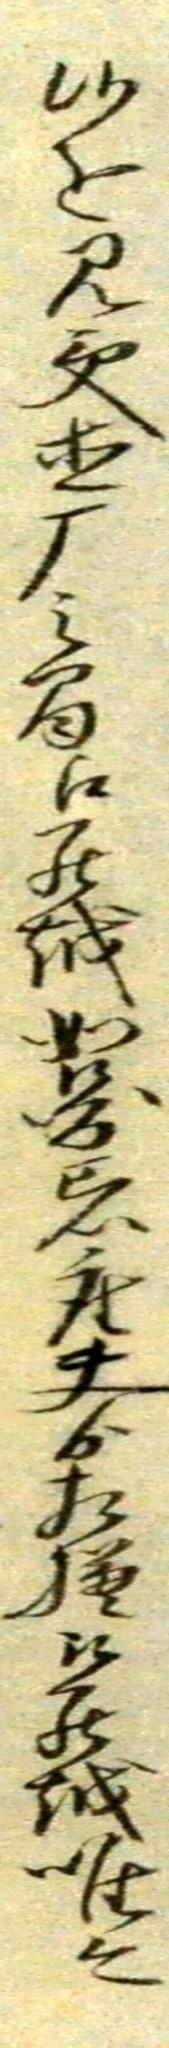候を見受置雁之間え罷越如圖着座夫ゟ相模え罷越唯今
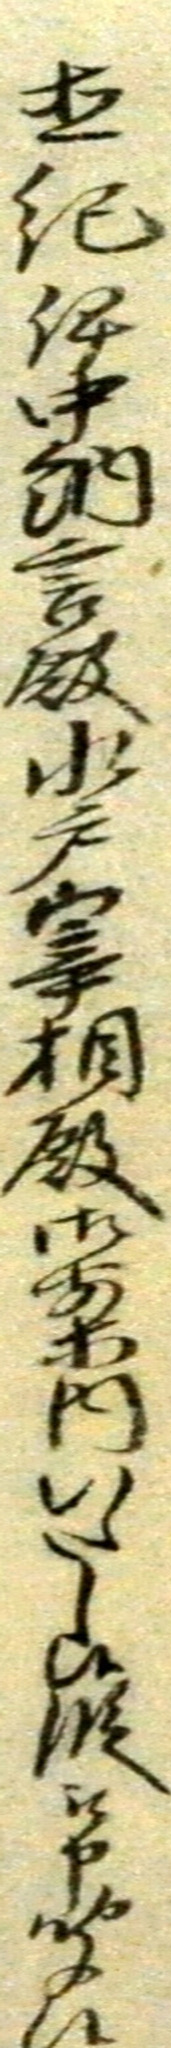直紀伊中納言殿水戸宰相殿御案内いたし候段被申聞候
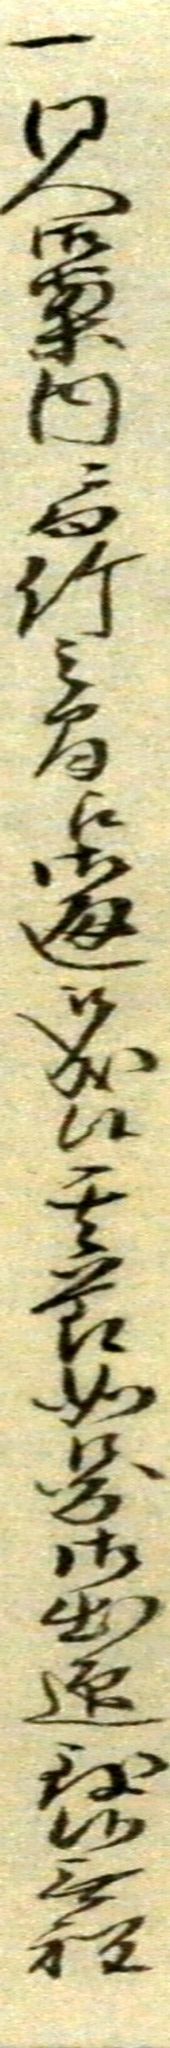一同人御案内ニ而竹之間え御返被成候其節如圖御出迎致候無程
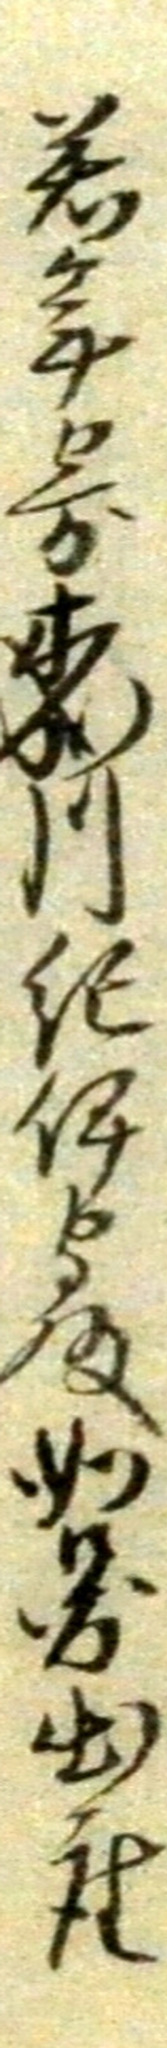若年寄森川紀伊守殿如圖出座
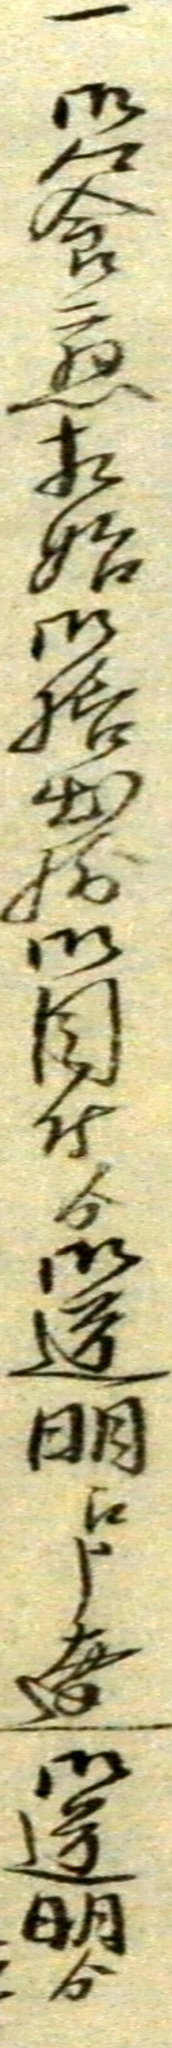一御饗應相始御膳出揃御目付ゟ御道朋え申達御道朋ゟ紀伊守殿え
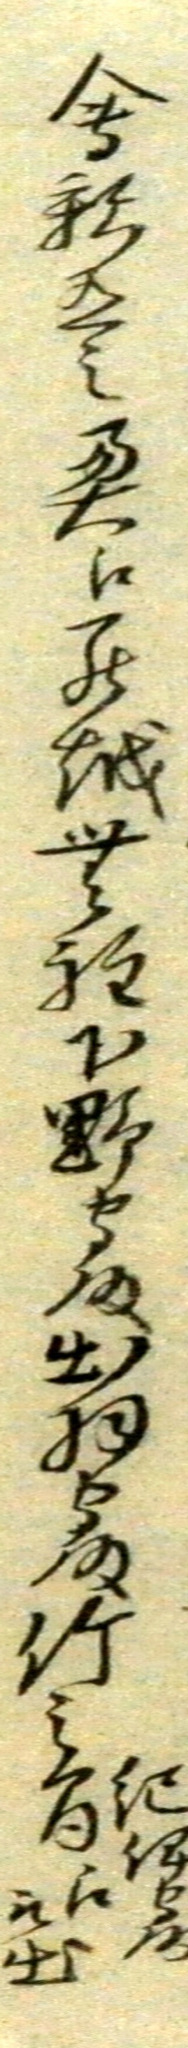會釈有之奥え罷越無程下野守殿出羽守殿竹之間え被出
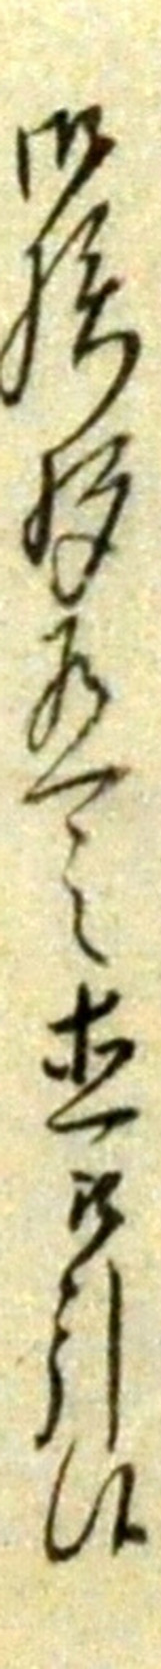御挨拶有之直被引候
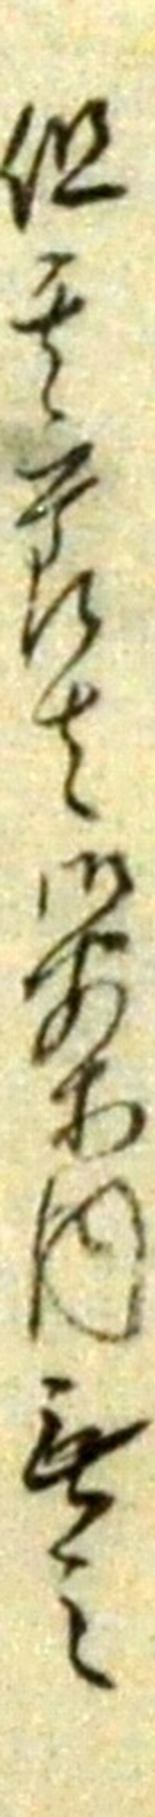但其節は御案内無之
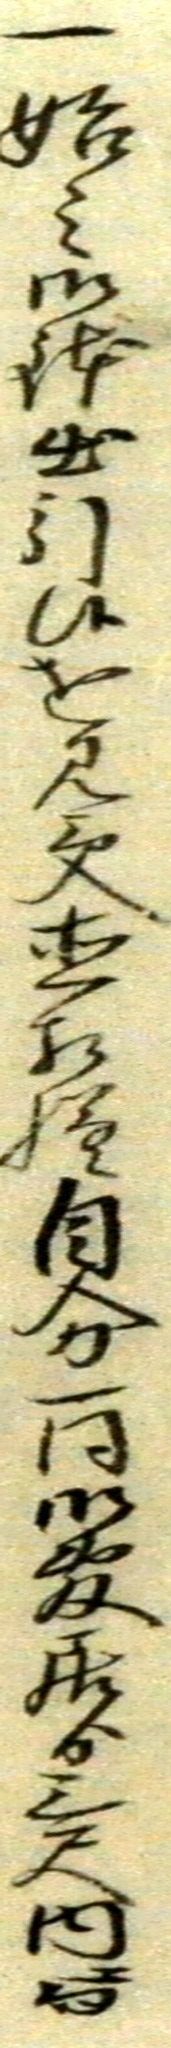一始之御鉢出引候を見受直相模自分一同御敷居ゟ三尺内ニ而
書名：竹ノ間御座席奉行勤方控外
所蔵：伊那市立高遠町図書館・合同会社AMANE
